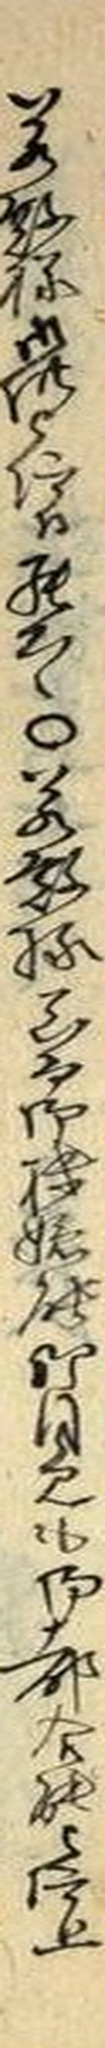若殿様御供被仰付罷出候○若殿様至而御機嫌能御目見も御都合能被仰上
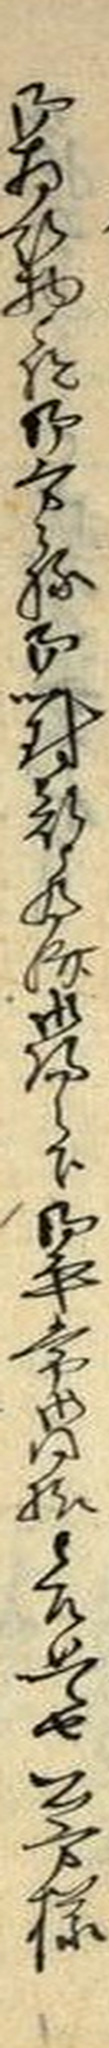御拝領物被遊御方々様御対顔被為済御湯之下御平常御同様被召上候由公方様
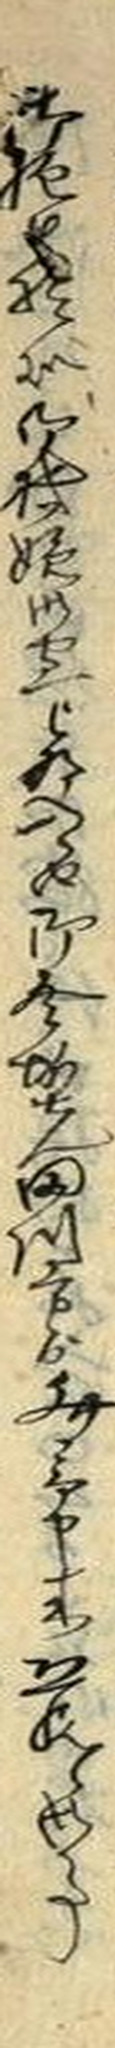御聴被遊候処御機嫌御宜被為入候由御登城先田川方ゟ文ニ而申来恐悦候御事
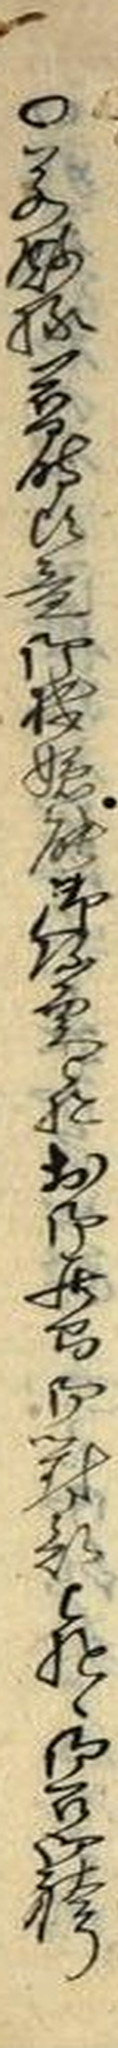○若殿様暮時頃益御機嫌能御帰殿被遊於御居間御対顔被遊候御召御袴

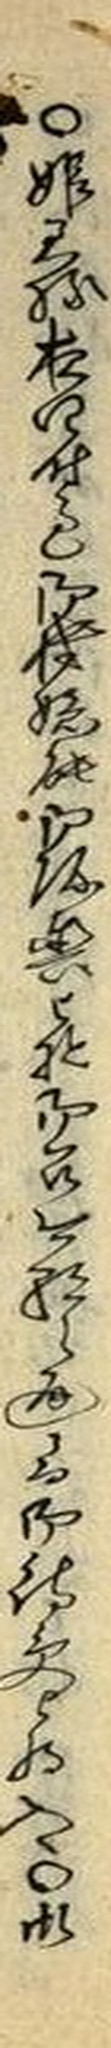○姫君様夜四時過御機嫌能御帰輿被遊御召今朝之通ニ而御待受被為入○御
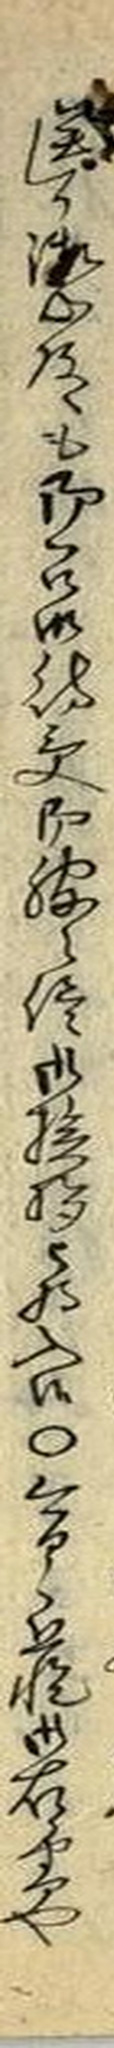送り瀬山殿へも御召御待受御服之侭御挨拶被為入候○今日之恐悦御右筆部や
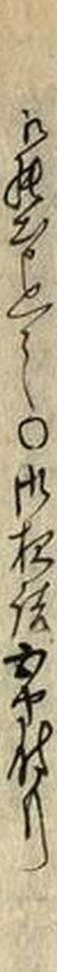江罷出申上之○御夜詰五半時引
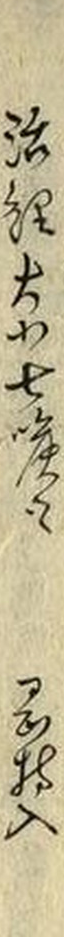活鯉大小七喉ツヽ岡持入
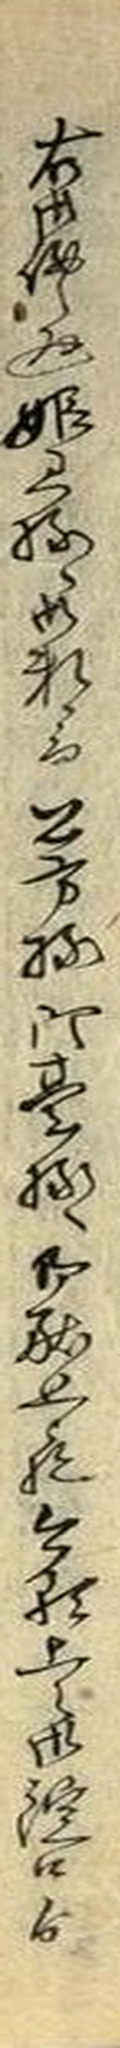右御例之通姫君様之御頼ニ而公方様御台様へ御献上被遊今朝上之御錠口ゟ
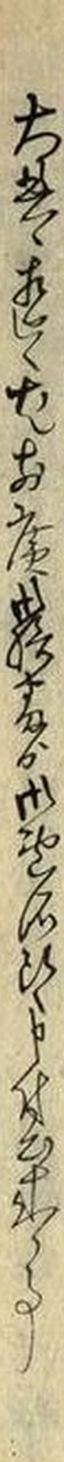大奥へ相廻候尤前広御膳番ゟ御台所頭へ申付出来候事
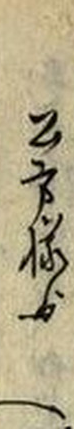公方様ゟ
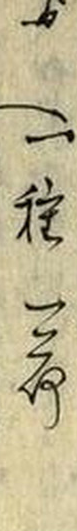一種一荷
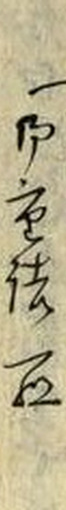御重詰一組
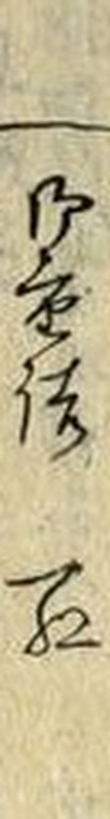御重詰一組
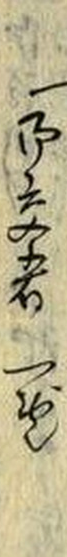御交肴一台
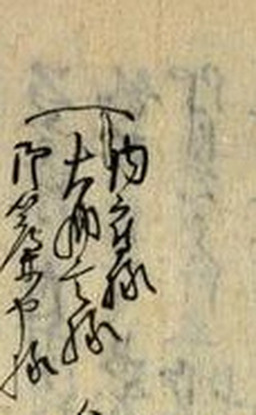内府様
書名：少傅日録抄（斉承付側向頭取日記、在府）
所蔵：福井県文書館 Fukui Prefectural Archives
